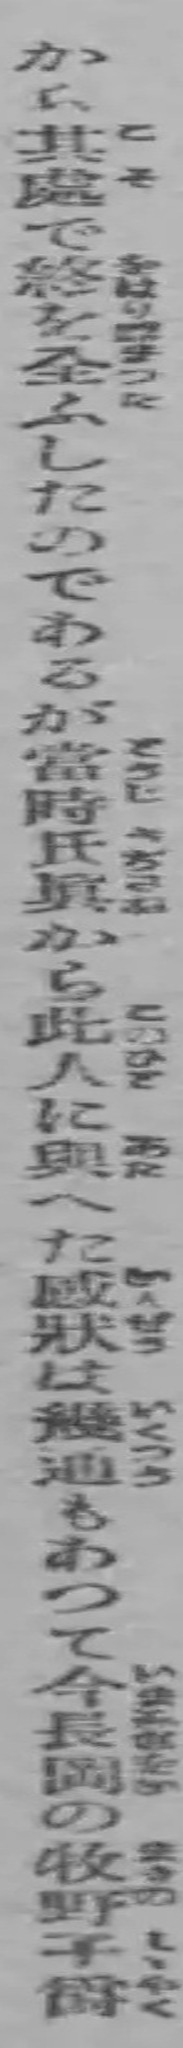から其処で終を全ふしたのであるが当時氏真から此人に与へた感状は幾通もあつて今長岡の牧野子爵
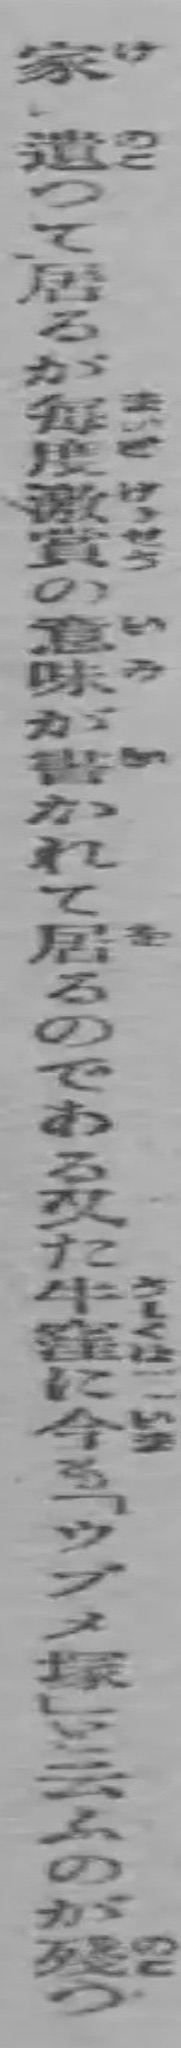家に遺つて居るが毎度激賞の意味が書かれて居るのである又た牛窪に今も「ウブメ塚」と云ふのが残つ

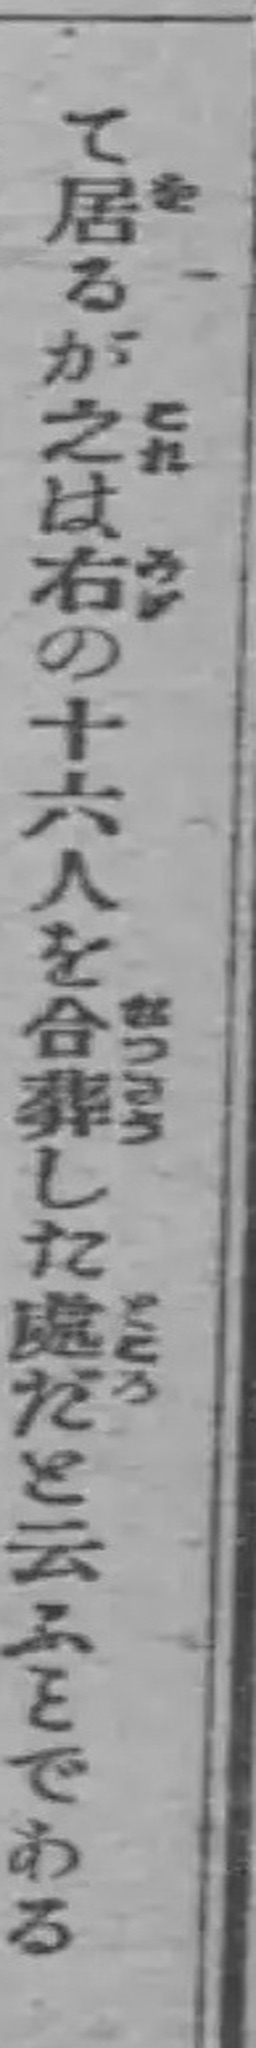て居るが之は右の十六人を合葬した処だとい云ふことである
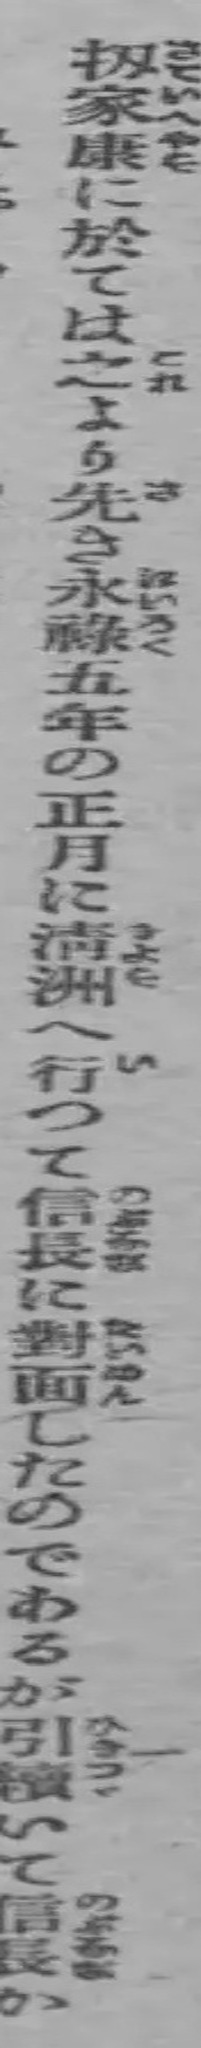清洲の会見扨家康に於ては之より先き永禄五年の正月に清洲へ行つて信長に対面したのであるが引続いて信長か
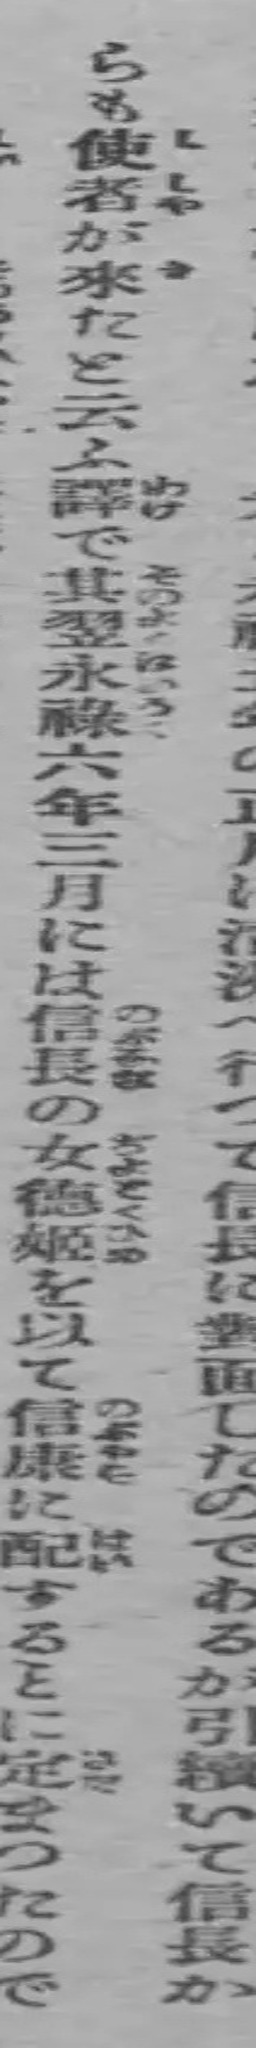らも使者が来たと云ふ訳で其翌永禄六年三月には信長の女徳姫を以て信康に配することに定まつたので
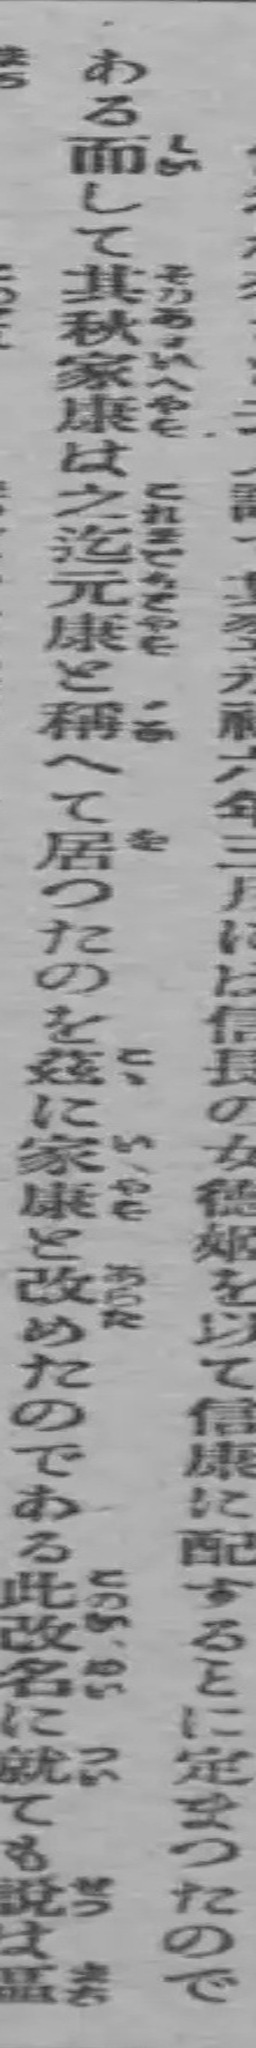家康改名ある而して其秋家康は之迄元康と称へて居つたのを茲に家康と改めたのである此改名に就ても説は区
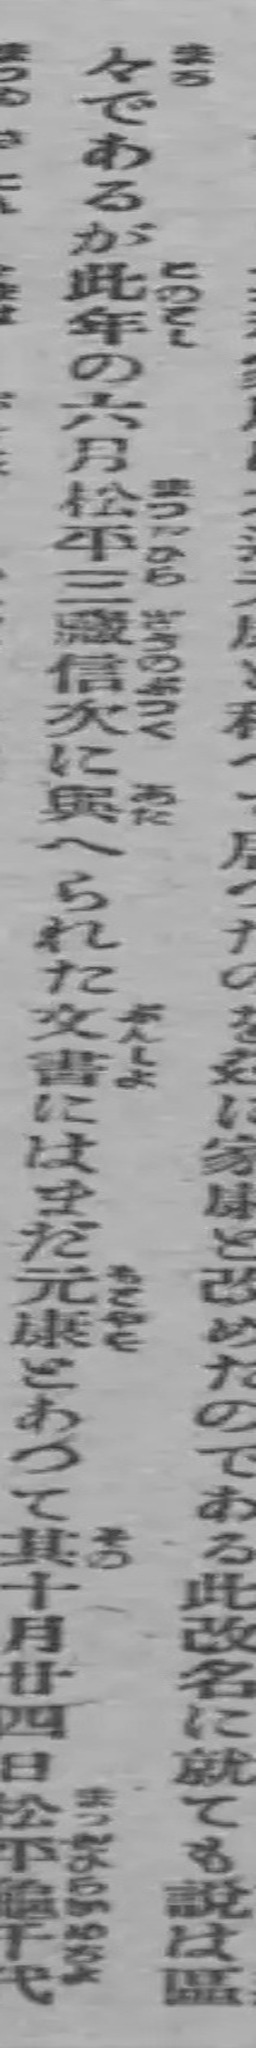区であるが此年の六月松平三蔵信次に与へられた文書にはまだ元康とあつて其十月廿四日松平亀千代
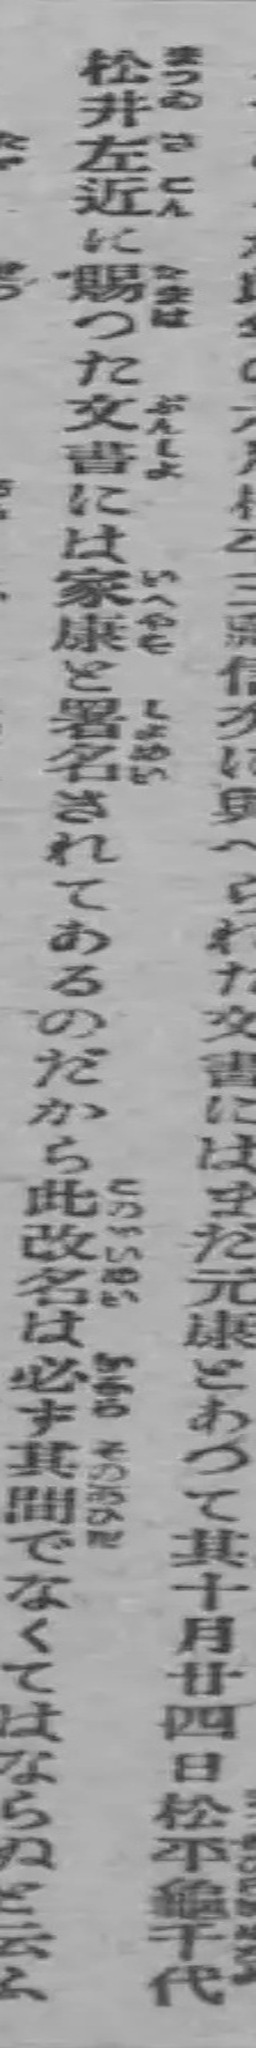松井左近に賜つた文書には家康と署名されてあるのだから此改名は必ず其間でなくてはならぬと云ふ
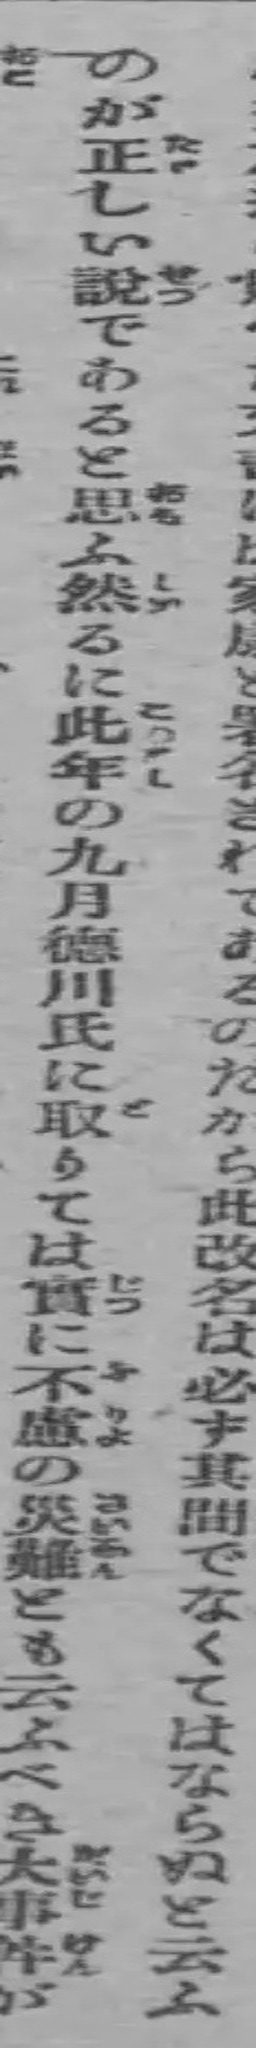のが正しい説であると思ふ然るに此年の九月徳川氏に取りては実に不慮の災難とも云ふべき大事件が
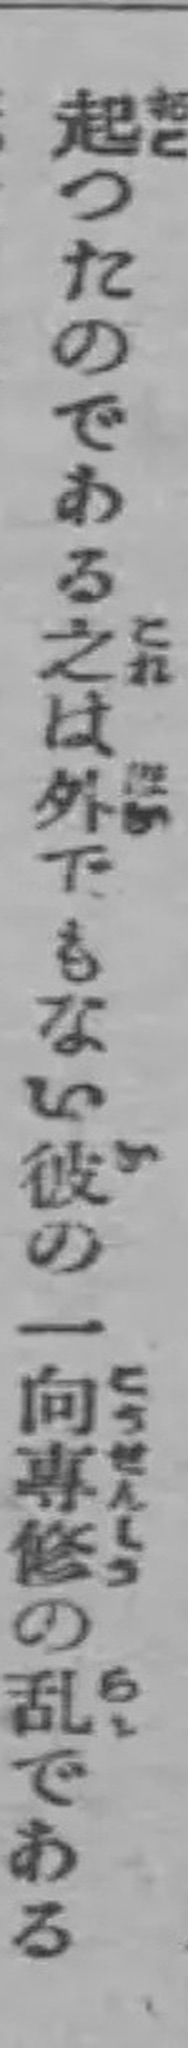起つたのである之は外でもない彼の一向専修の乱である
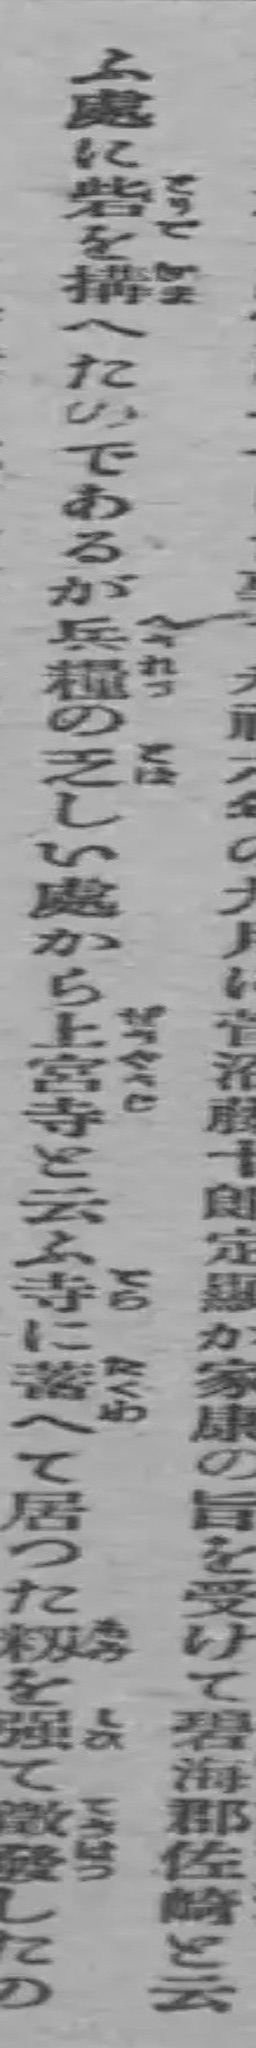ふ処に砦を搆へたのであるが兵糧の乏しい処から上宮寺と云ふ寺に蓄へて居つた籾を強て徴発したの
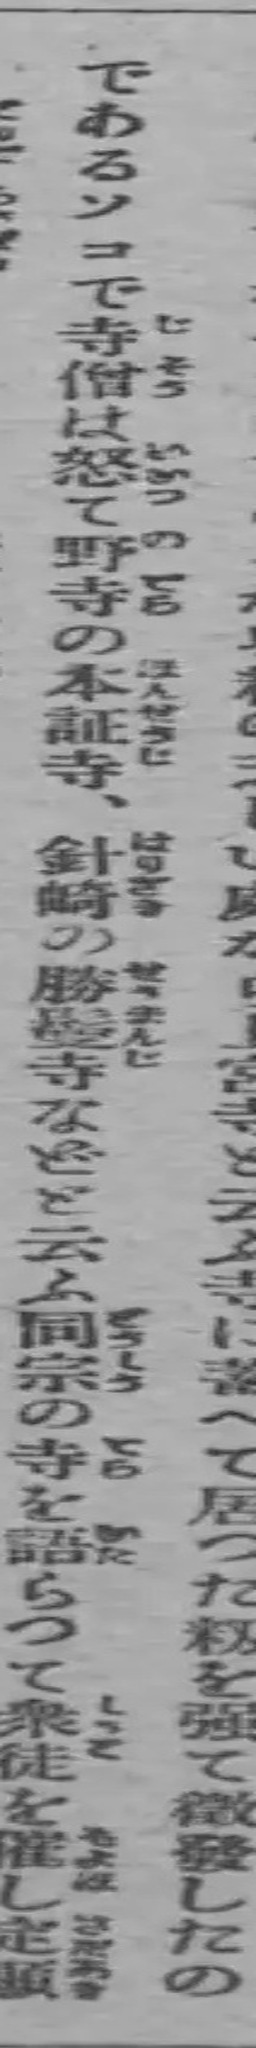であるソコで寺僧は怒て野寺の本証寺、針崎の勝曼寺などと云ふ同宗の寺を語らつて衆徒を催し定顕
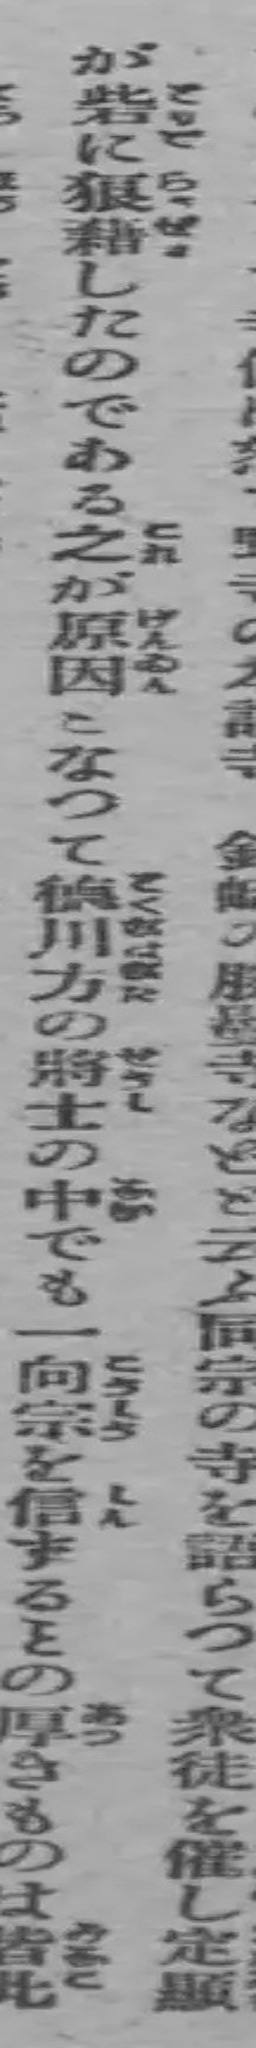が砦に狼藉したのである之が原因となつて徳川方の将士の中でも一向宗を信ずることの厚きものは皆此
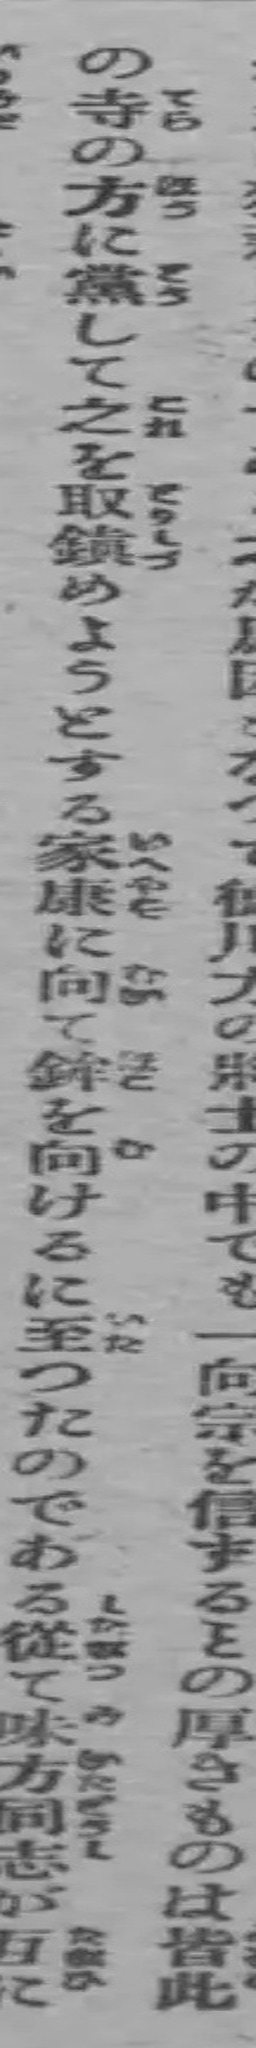の寺の方に党して之を取鎮めようとする家康に向鉾を向けるに至つたのである従て味方同志が互に
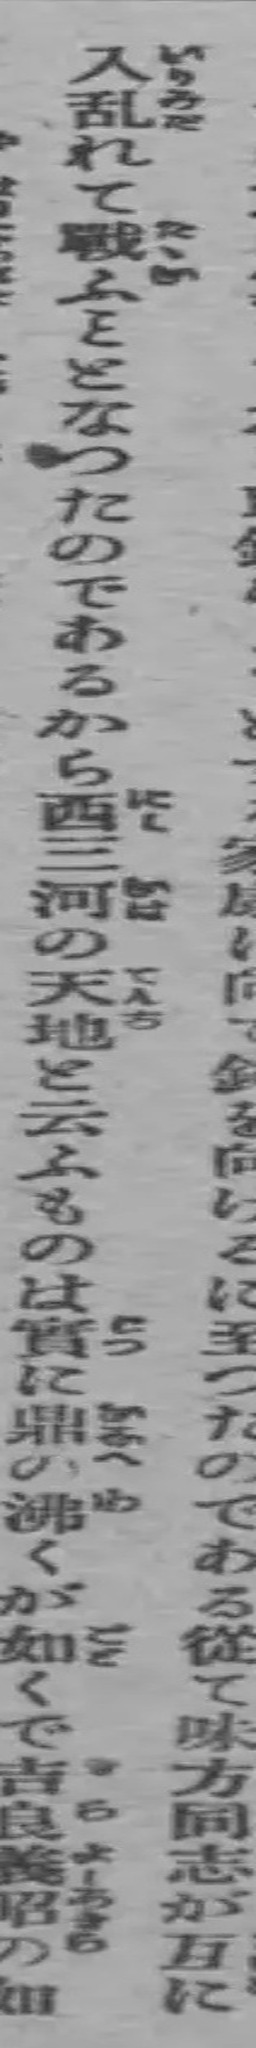入乱れて戦ふこととなつたのであるから西三河の天地と云ふものは実に鼎の沸くが如くで吉良義昭の如
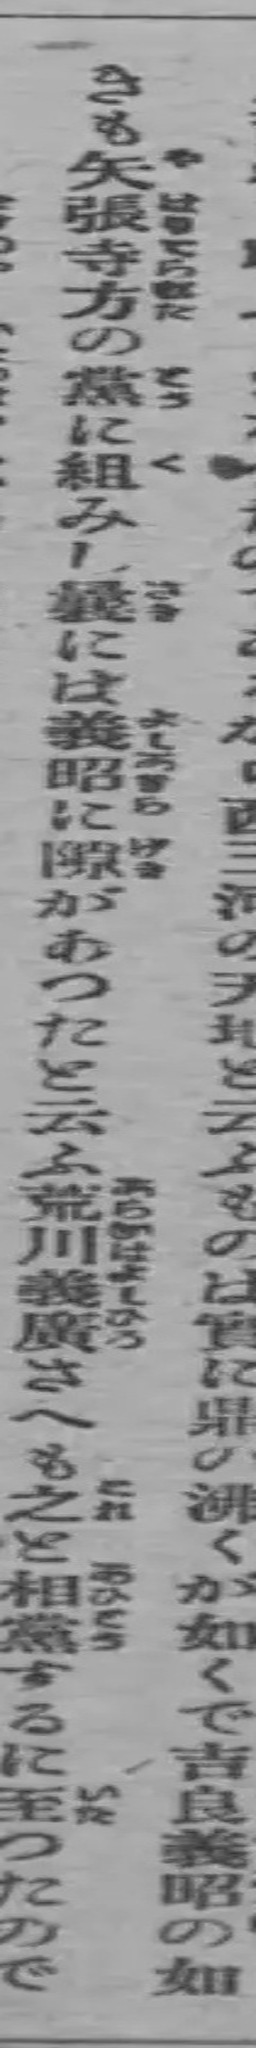きも矢張寺方の党に組みし曩には義昭に隙があつたと云ふ荒川義広さへも之と相党するに至つたので
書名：豊橋市史談
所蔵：国立国会図書館 National Diet Library, JAPAN
